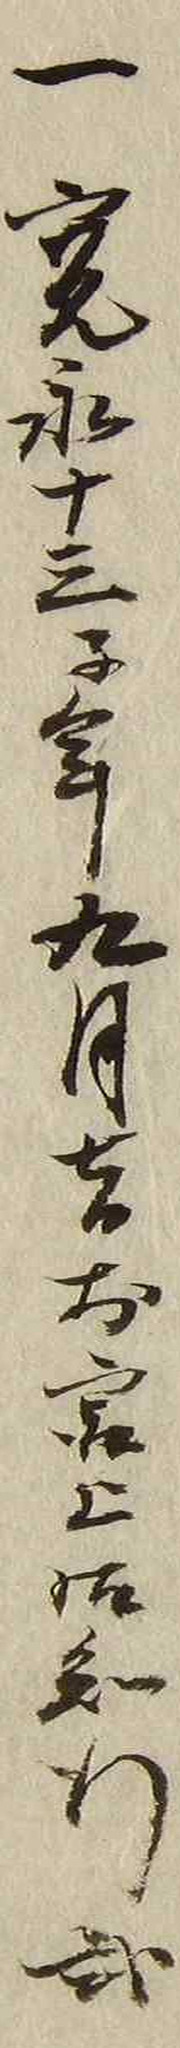一寛永十三子年九月七日於最上御知行弐
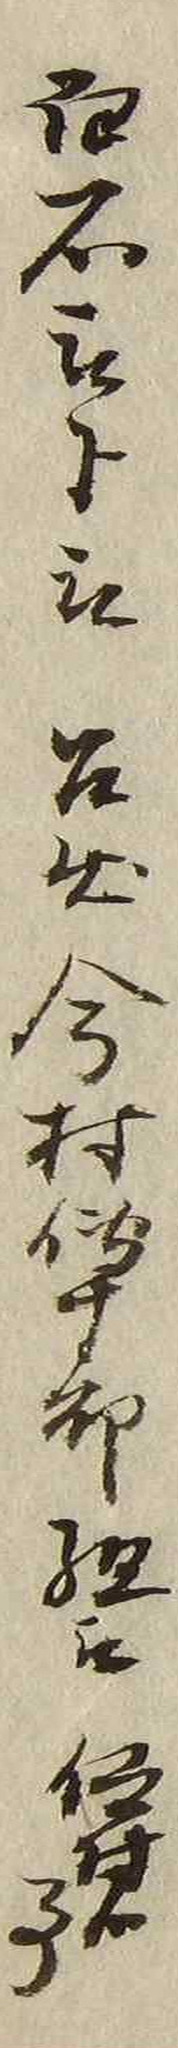百石被下被召出今村伝十郎組被仰付候事

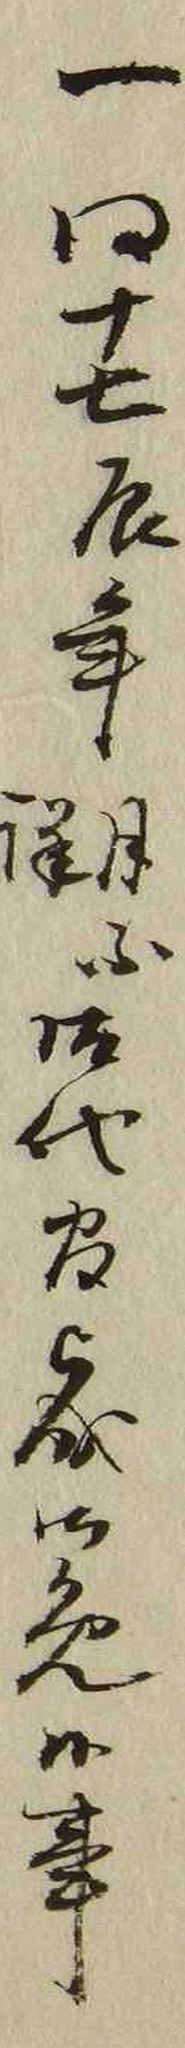一同十七辰年月不詳御代官被成御免候事
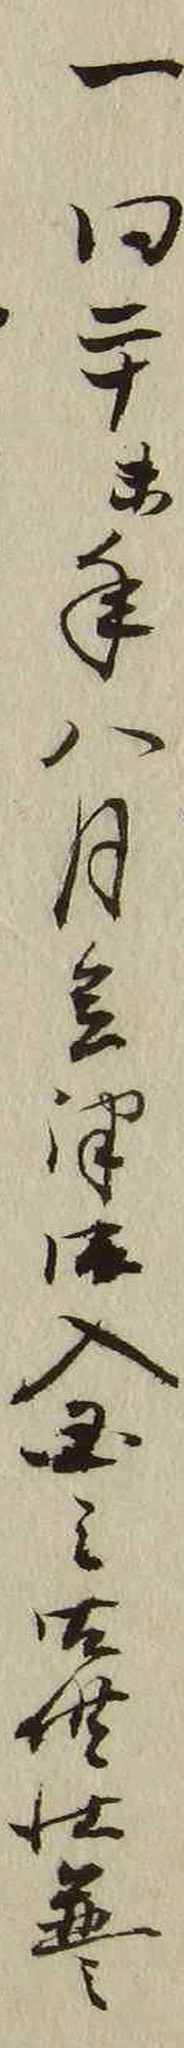一同二十未年八月会津御入国之御供仕並之
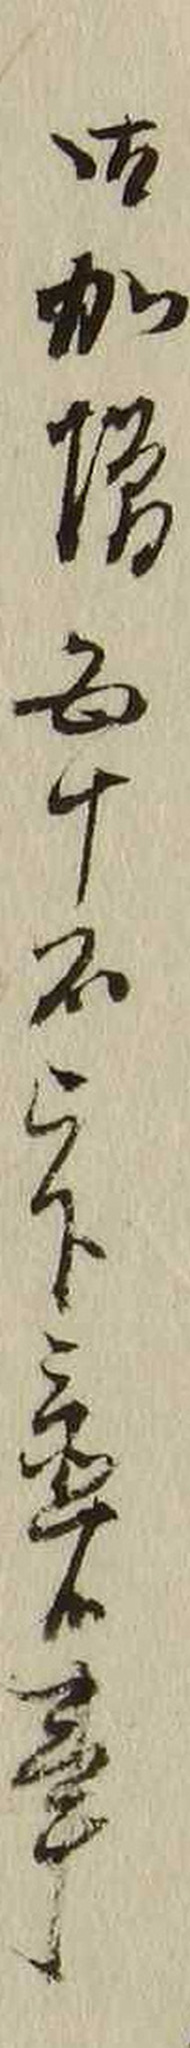御加増五十石被下置候事
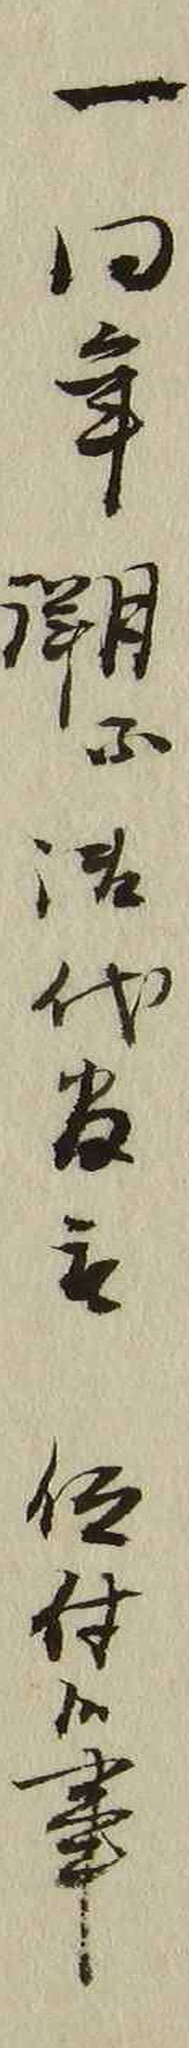一同年月不詳御代官被仰付候事
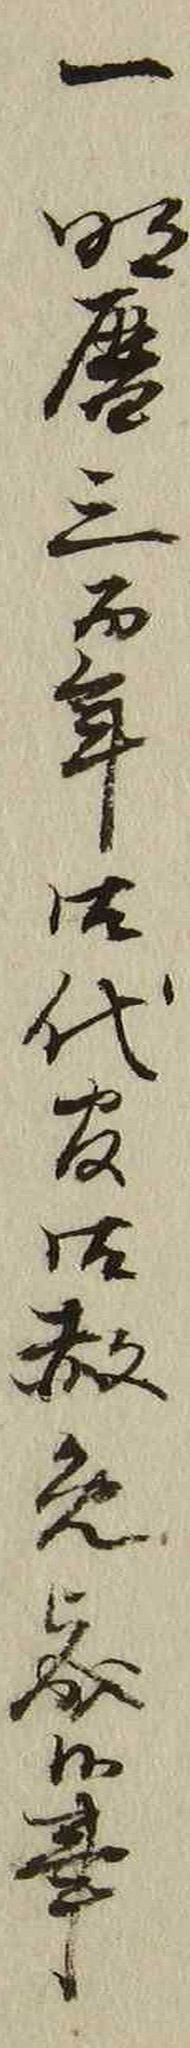一明暦三酉年御代官御赦免被成候事
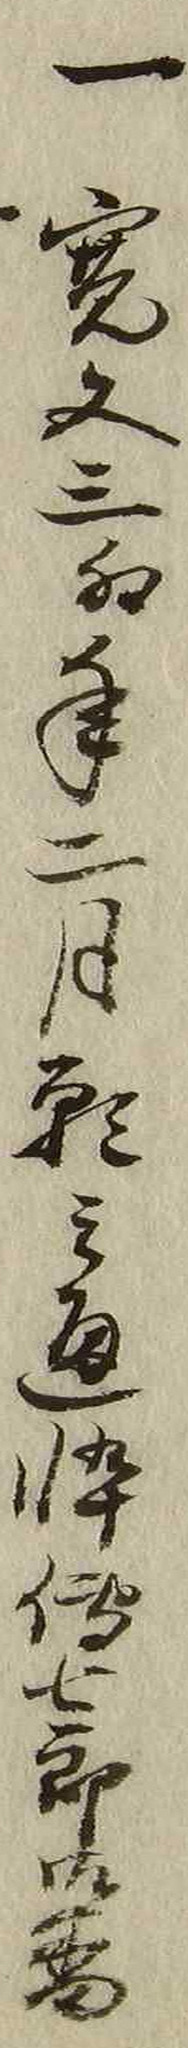一寛文三卯年二月願之通忰伝七郎御番
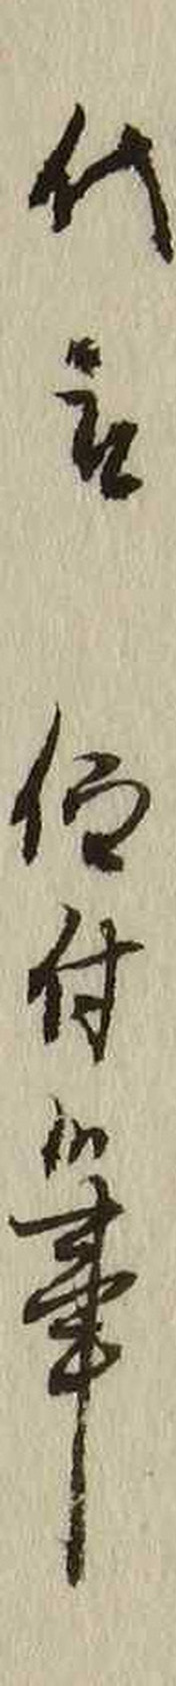代被仰付候事
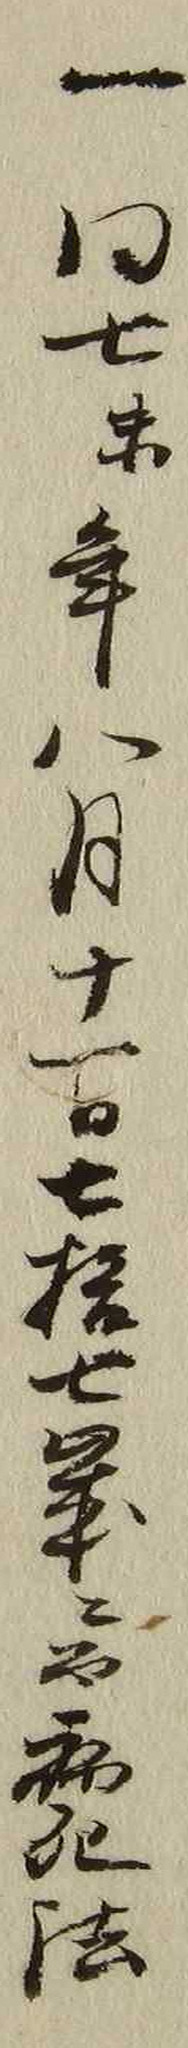一同七未年八月十一日七拾七歳ニ而病死法
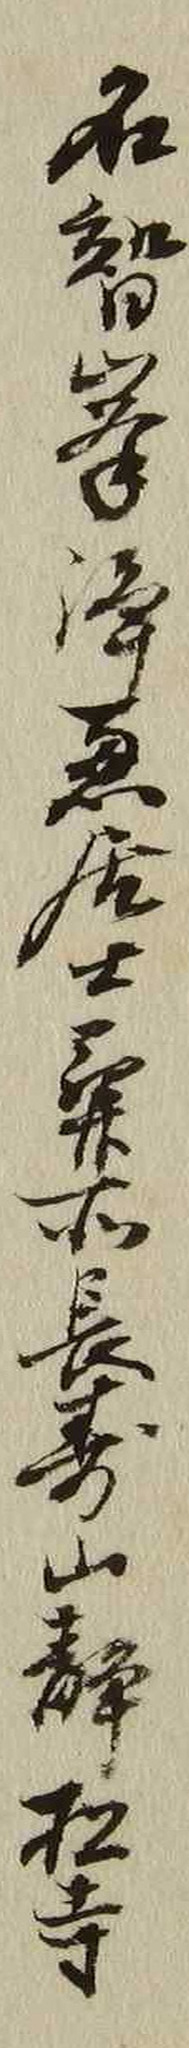名智峰浄恵居士葬所長寿山静松寺
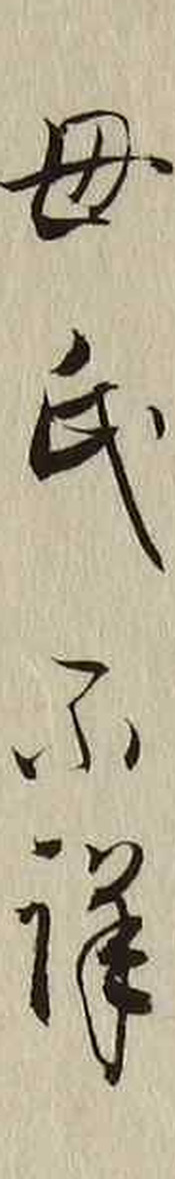母氏不詳
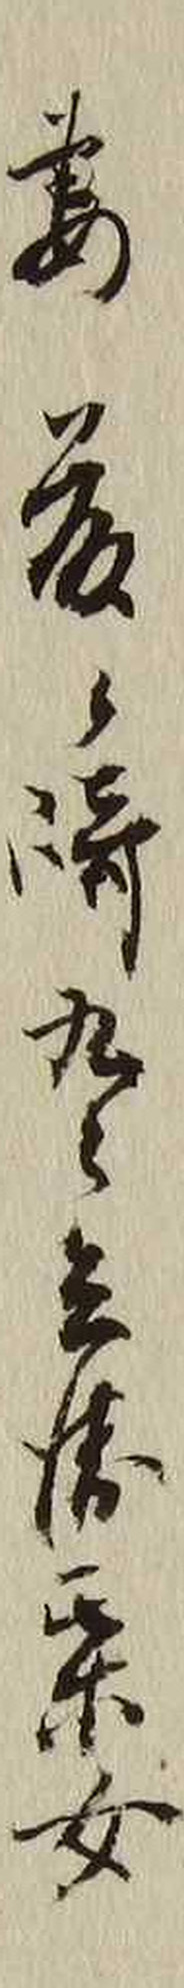妻藤ケ崎九郎兵衛某女
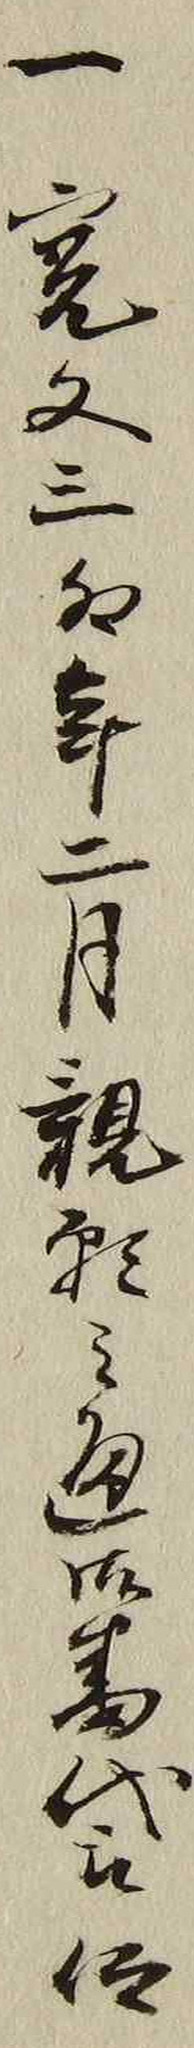一寛文三卯年二月親願之通御番代被仰
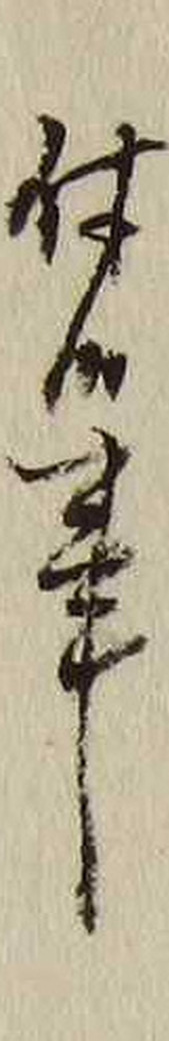付候事
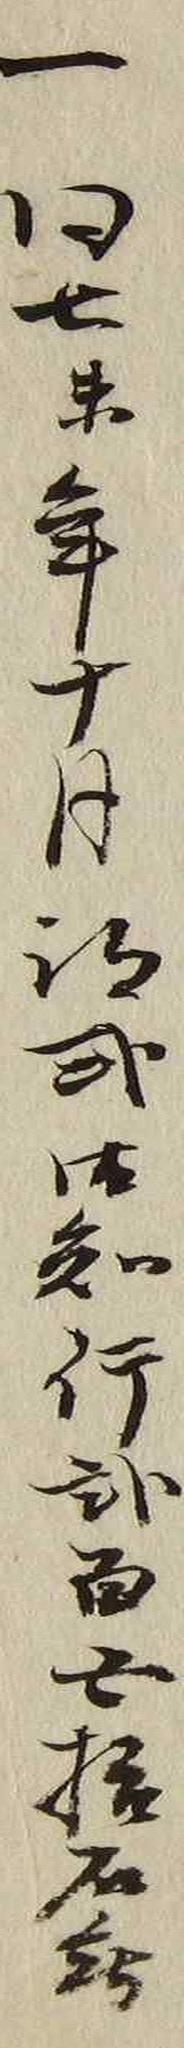一同七未年十月跡式御知行弐百五拾石無
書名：諸士系譜　巻之349　も之部5
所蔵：会津若松市立会津図書館
